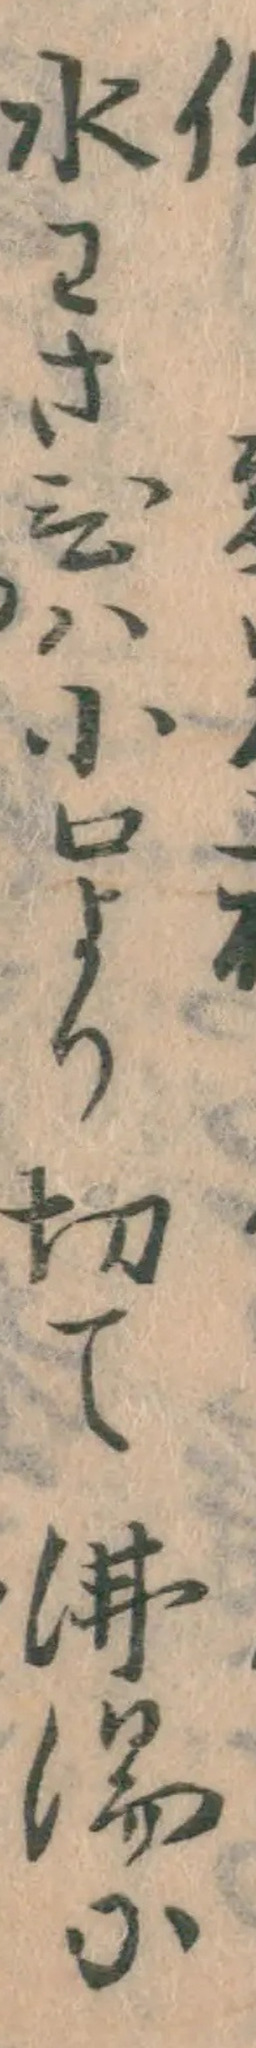水わさひは小口より切て沸湯に
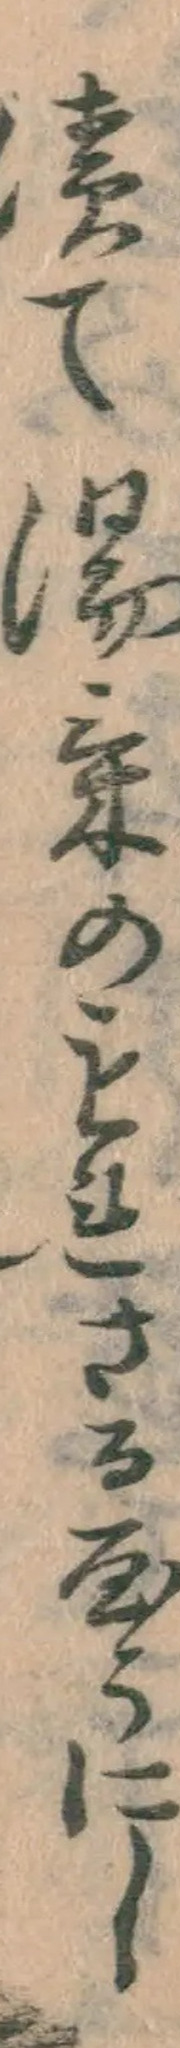漬て湯気のもれさるやうにし
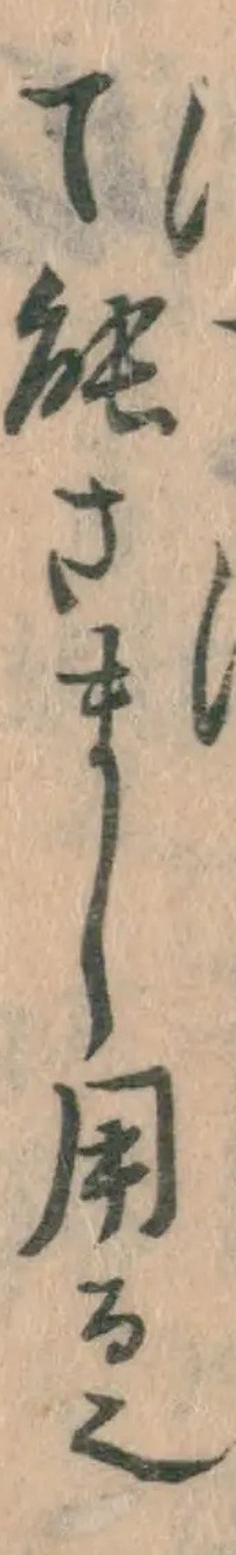て能さまし用る也
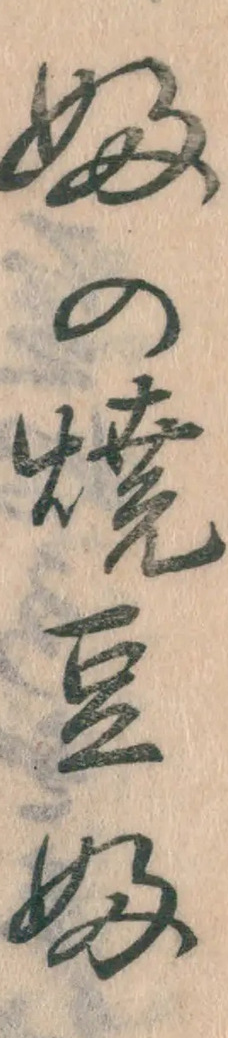ふの焼豆ふ
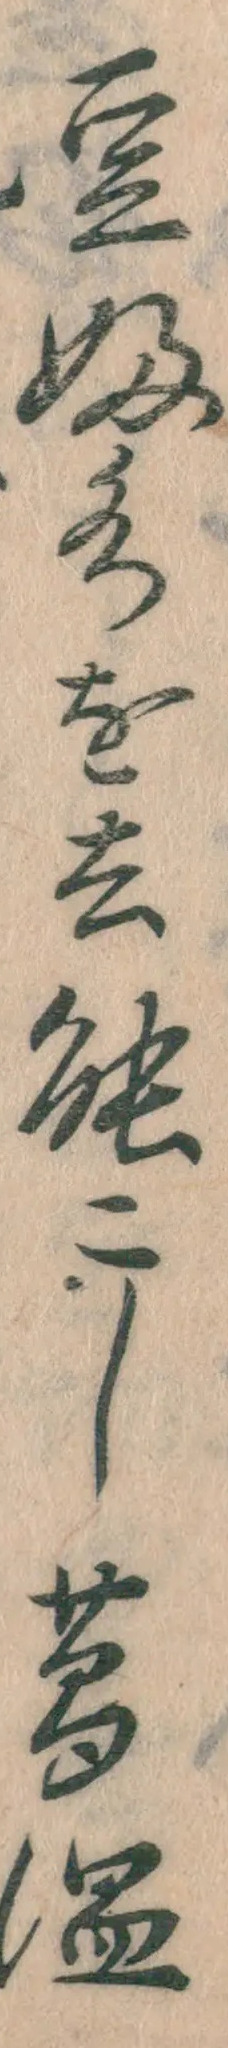豆ふ水を去能こし葛温
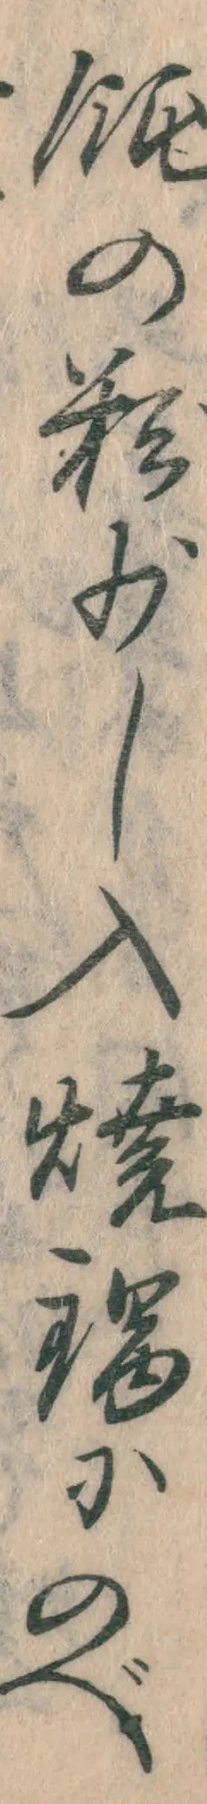飩の粉少し入焼鍋にのべ
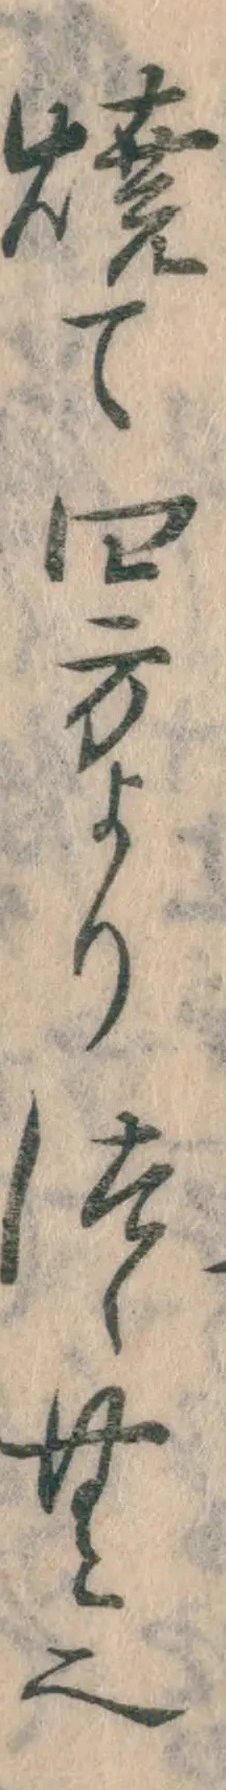焼て四方よりつゝむ也
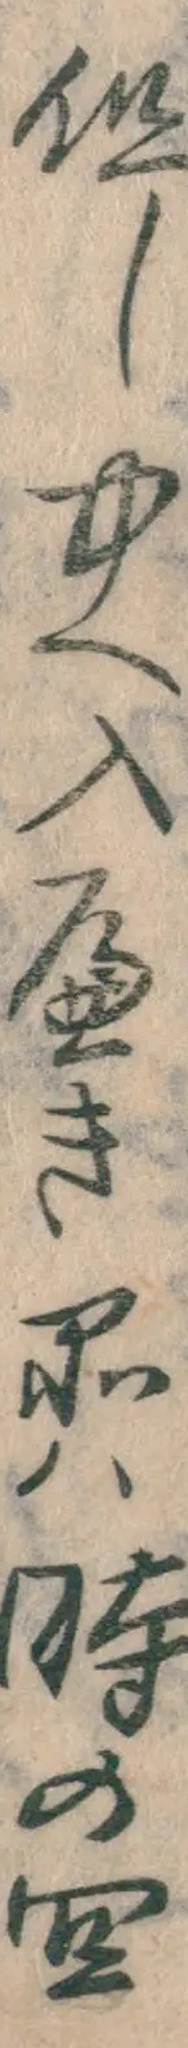但し中へ入へき品は時の宜
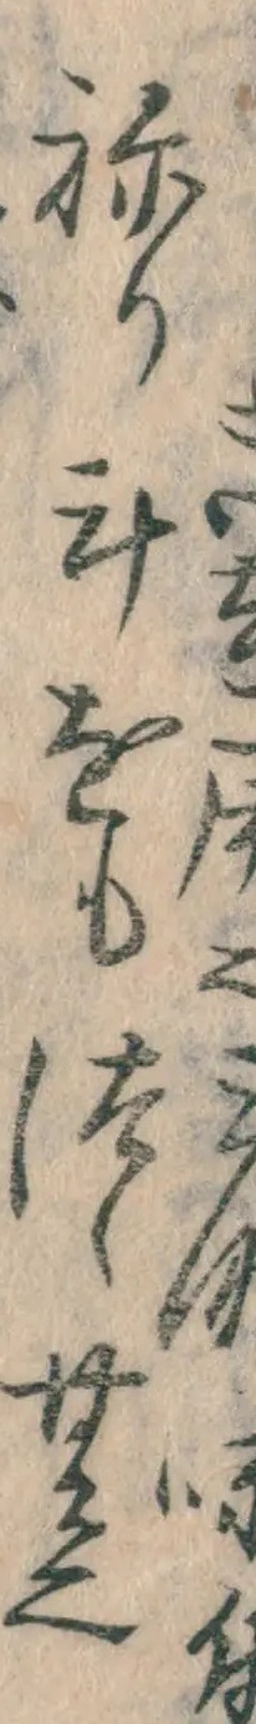ねり斗をもつゝむ也
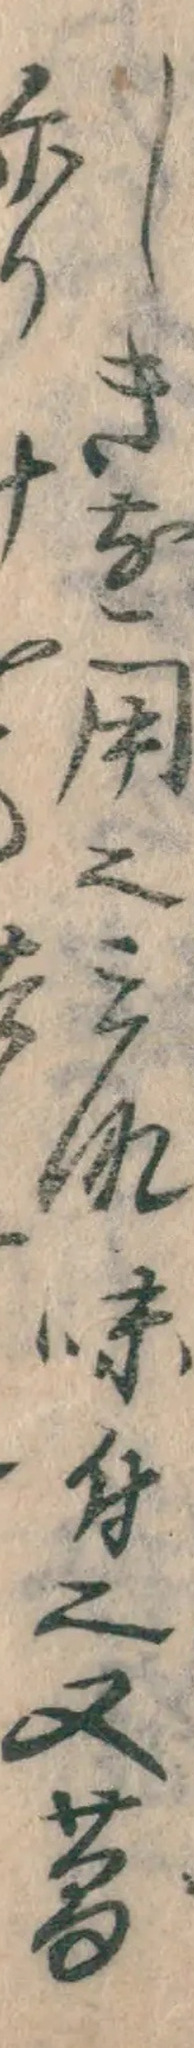しきを用也みな味付也又葛
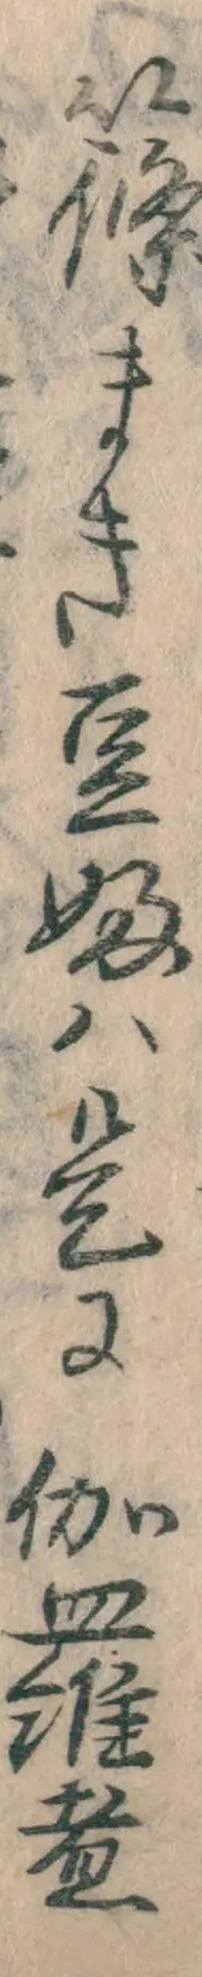篠まき豆ふは是に伽羅煮
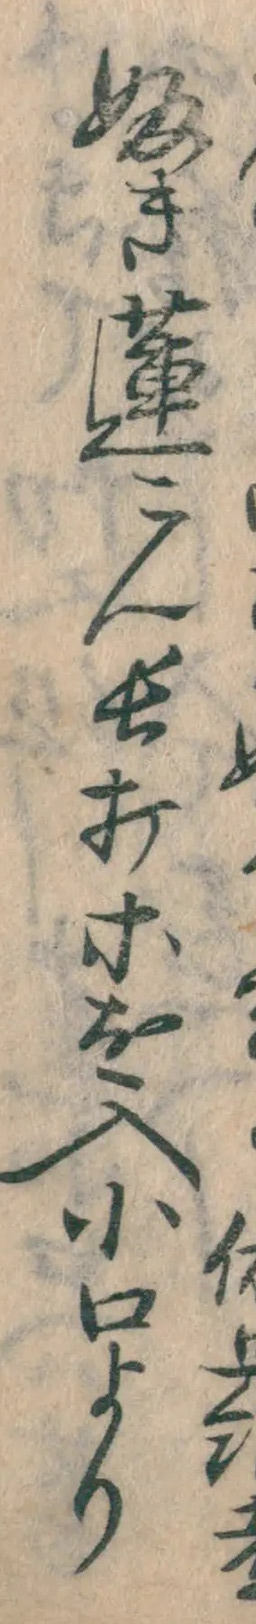ふき蓮こん長打等を入小口より

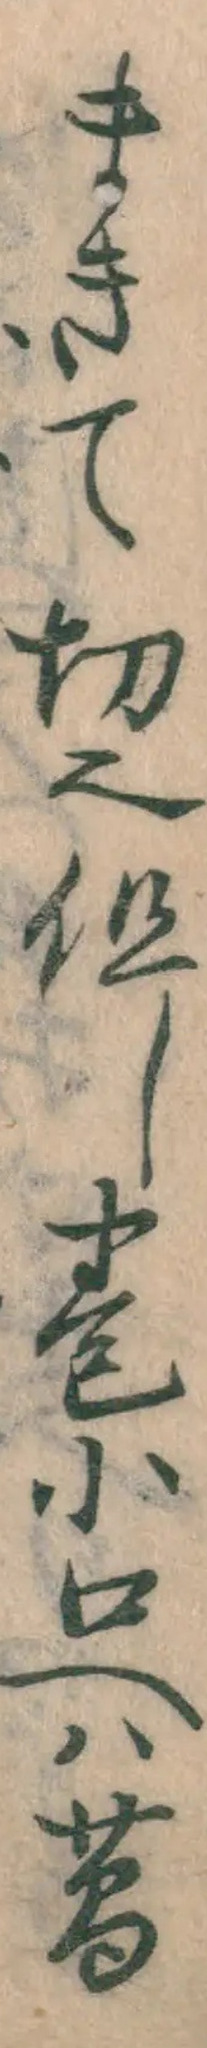まきて切也但し巻小口へは葛
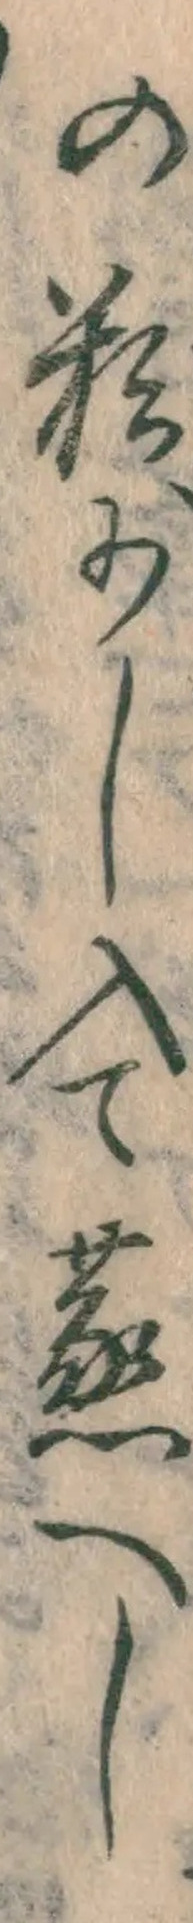の粉少し入て蒸へし
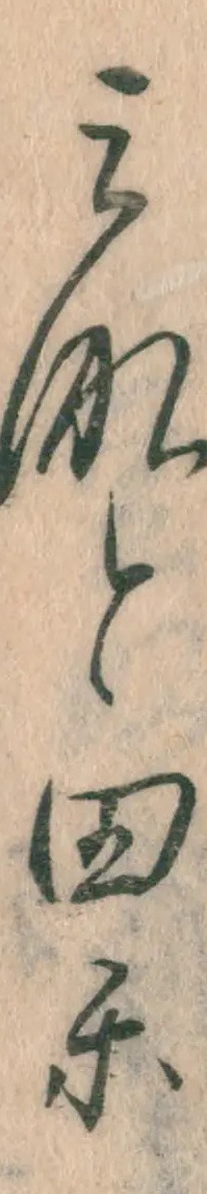みなと田楽
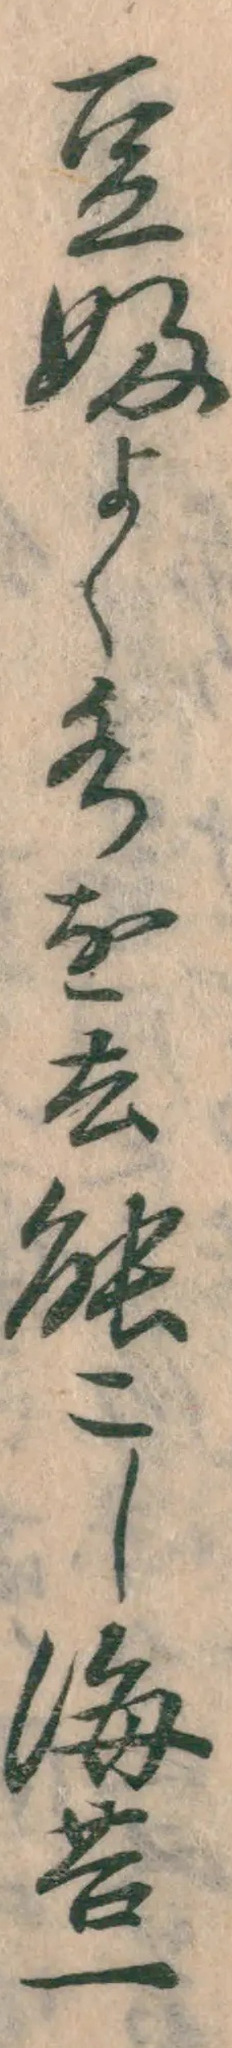豆ふよく水を去能こし海苔一
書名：豆腐百珍余録
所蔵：国立国会図書館 National Diet Library, JAPAN
